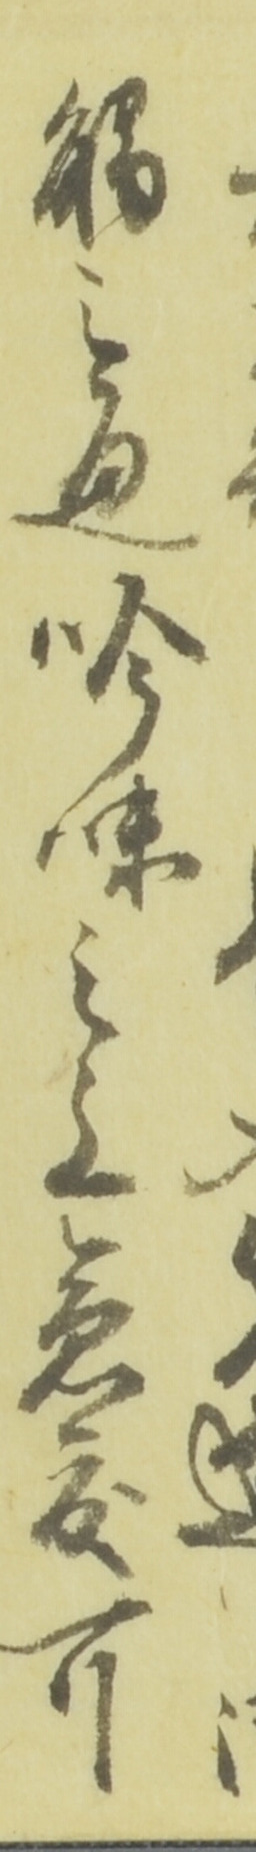触之通吟味之上急度可
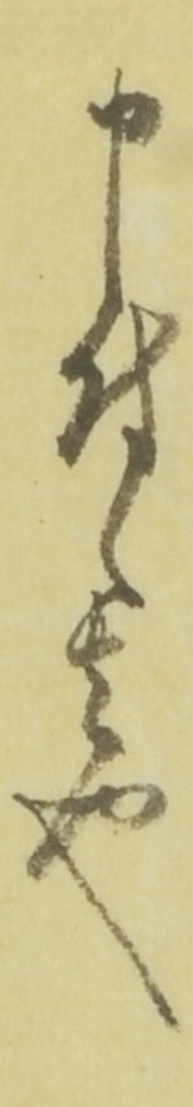申付候者也
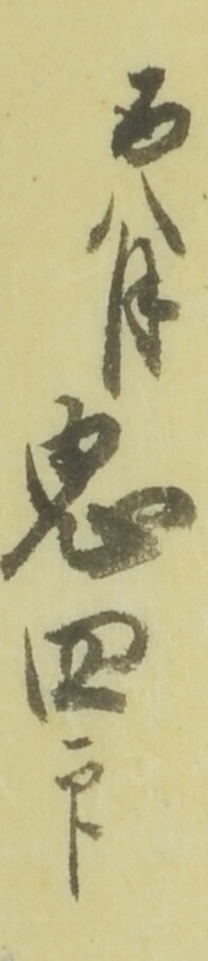酉八月忠四印
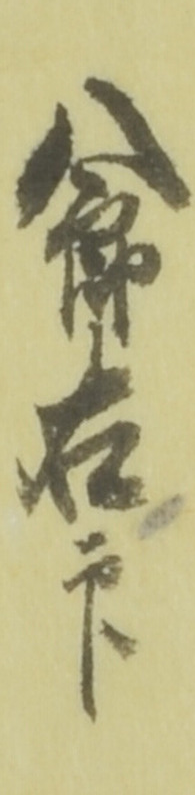八郎右印
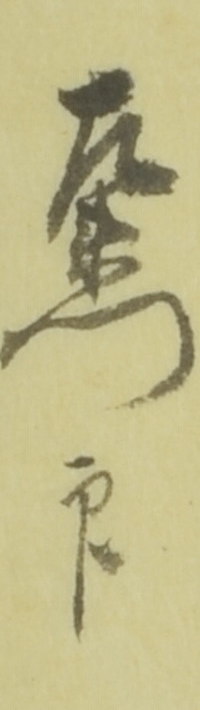左衛門印
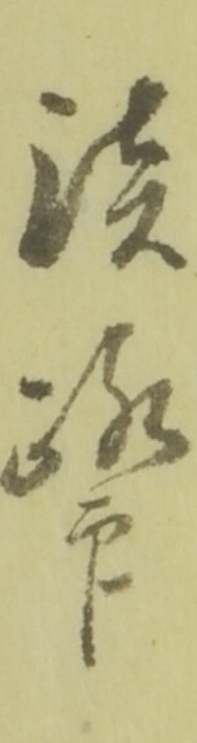淡路印
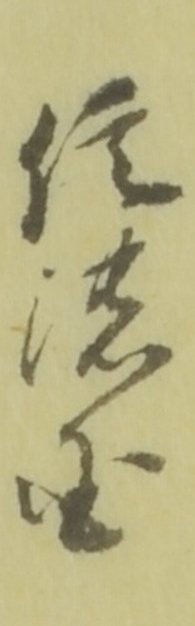信濃国
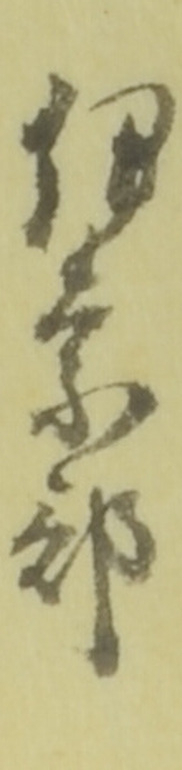伊奈郡
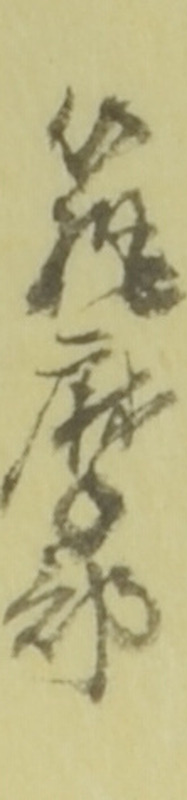筑摩郡
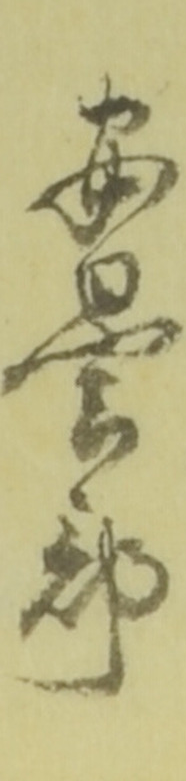安曇郡
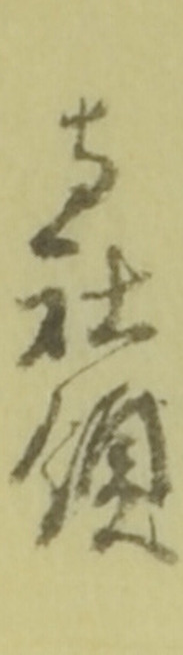寺社領

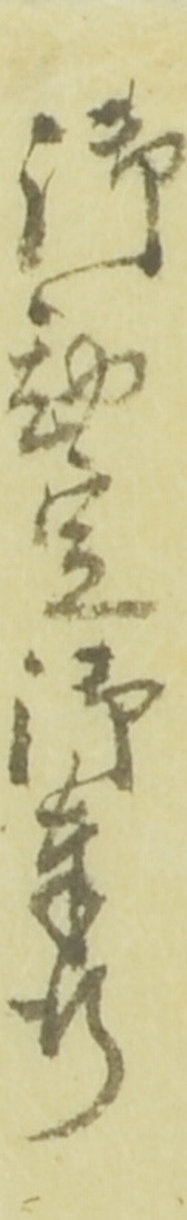御勘定御奉行
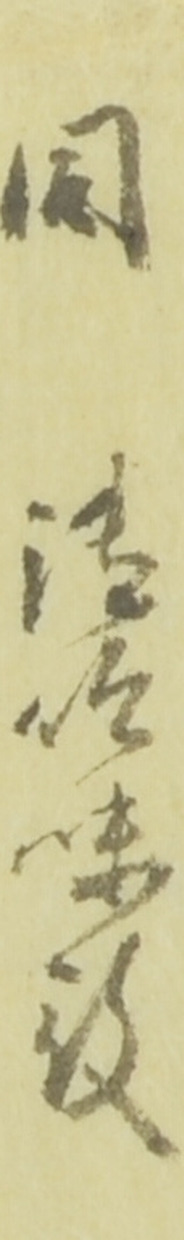同御吟味役
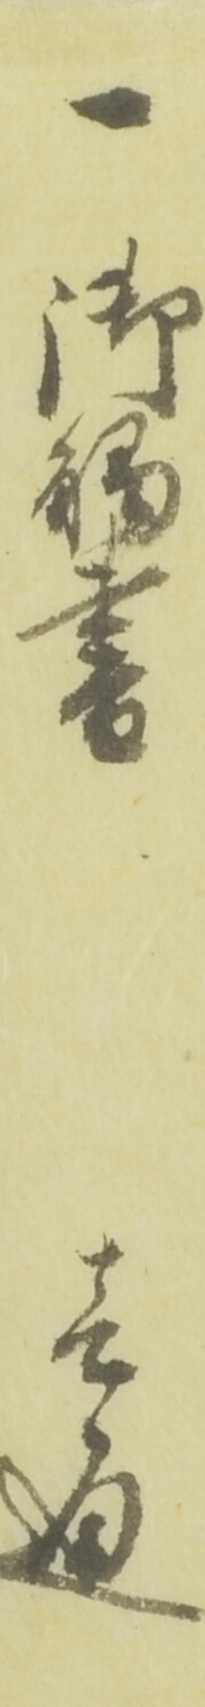一御触書壱通
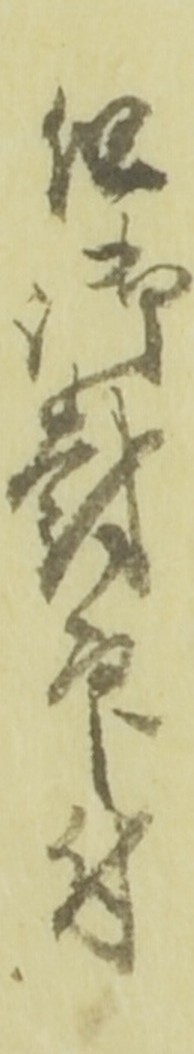但御封印付
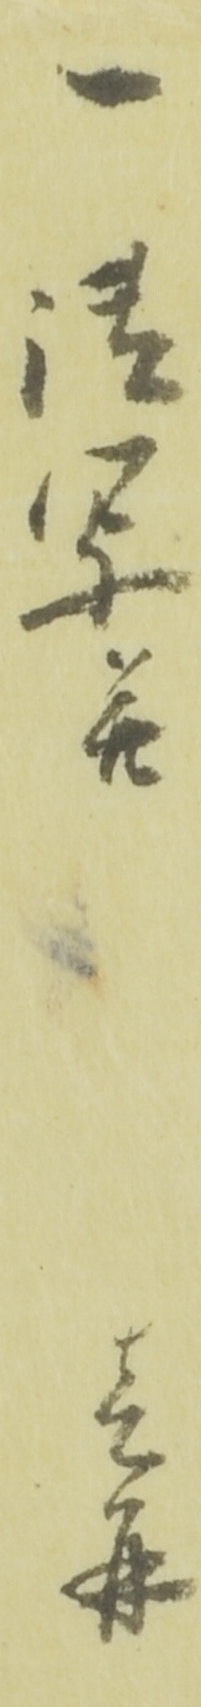一御写并壱冊
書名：御触書御書附控
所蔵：伊那市立高遠町図書館・合同会社AMANE
